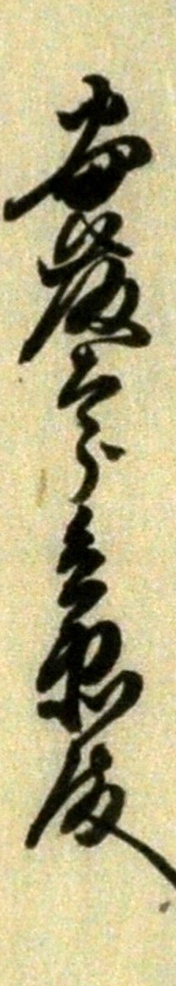安藤太郎兵衛殿
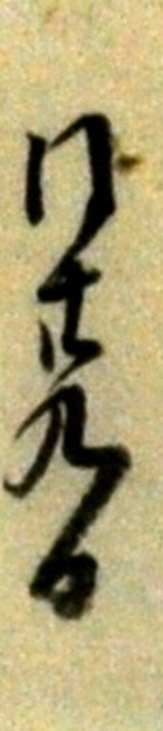同廿九日
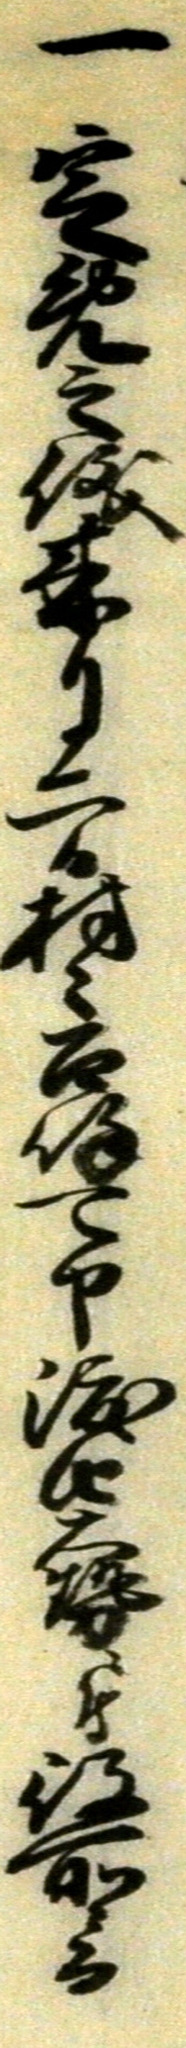一定免之儀来月二日村々召呼可申渡由大勢ニ付役所ニ而
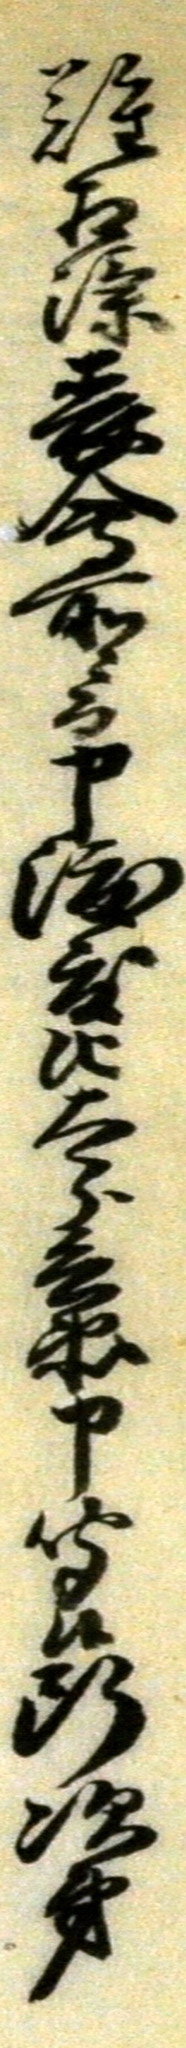難相済表会所ニ而申渡度由太郎兵衛申聞候断次第
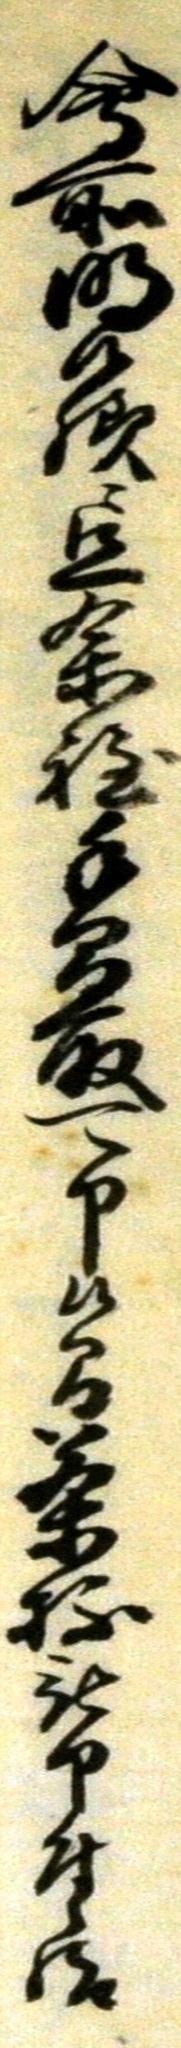会所明候様ニ且余程手間取可申候間茶抔被申付候様
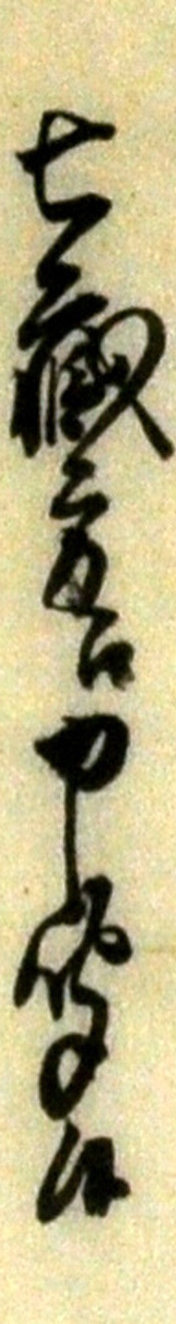蔵方江申聞候
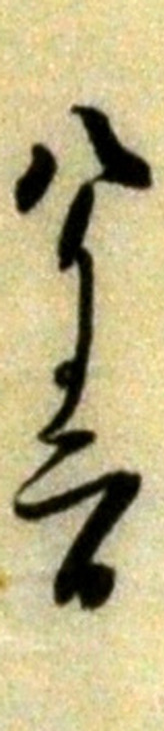八月三日
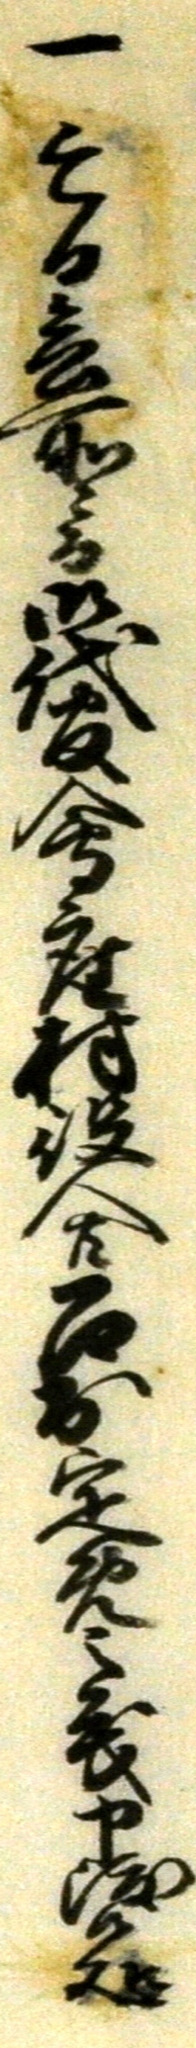一今日会所ニ而御代官会座村役人共召出定免之義申渡候処
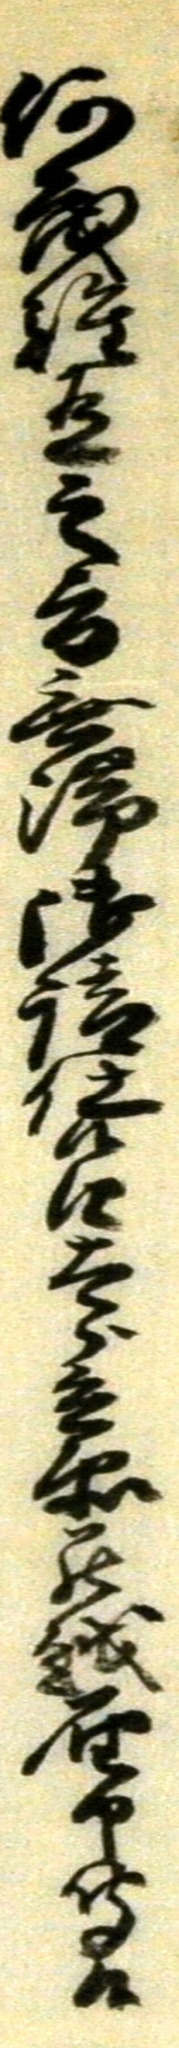何茂難有之旨無滞御請仕候由太郎兵衛罷越届申聞候
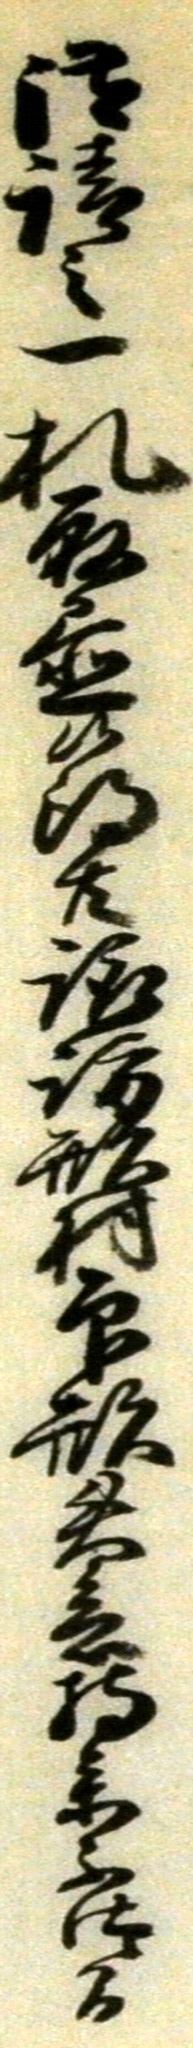御請之一札取置候得共諏訪形村印形失念持参不仕候間
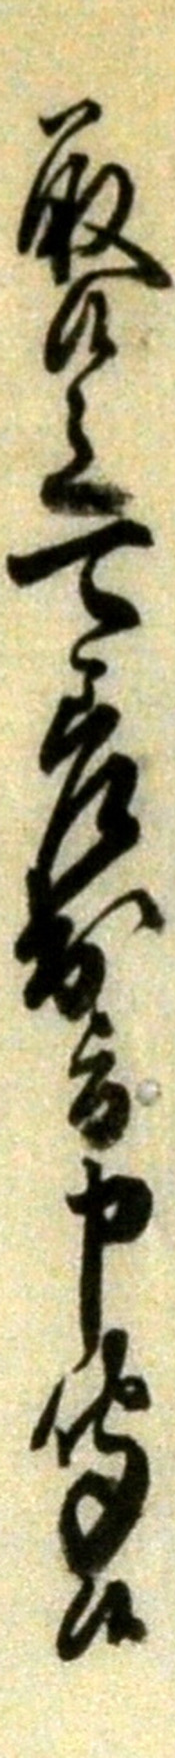取候上可差出旨申聞候
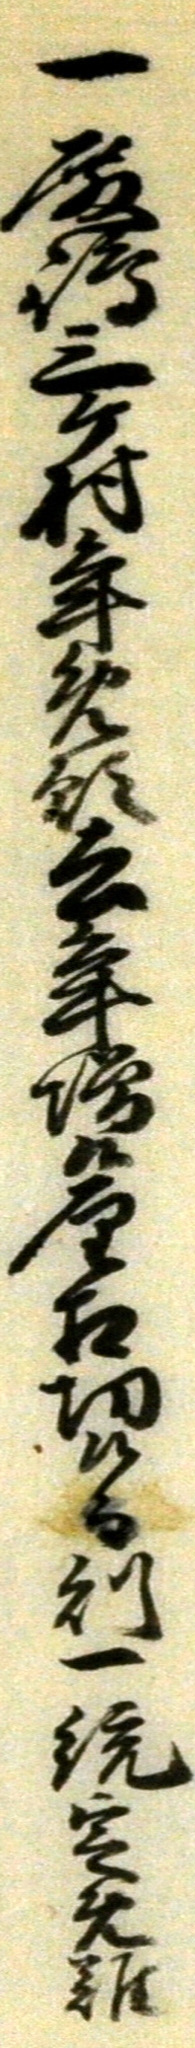一殿嶋村三ヶ村年免願去年増候厘相切候而則一統定免難
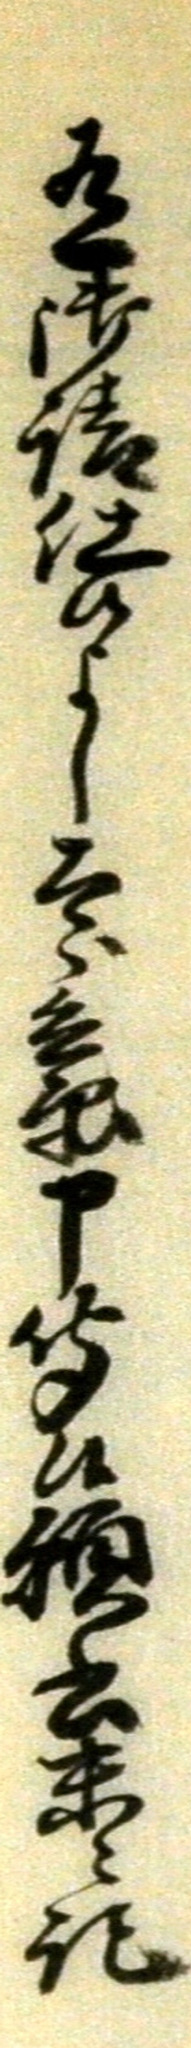有御請仕候よし太郎兵衛申聞候願書末ニ記
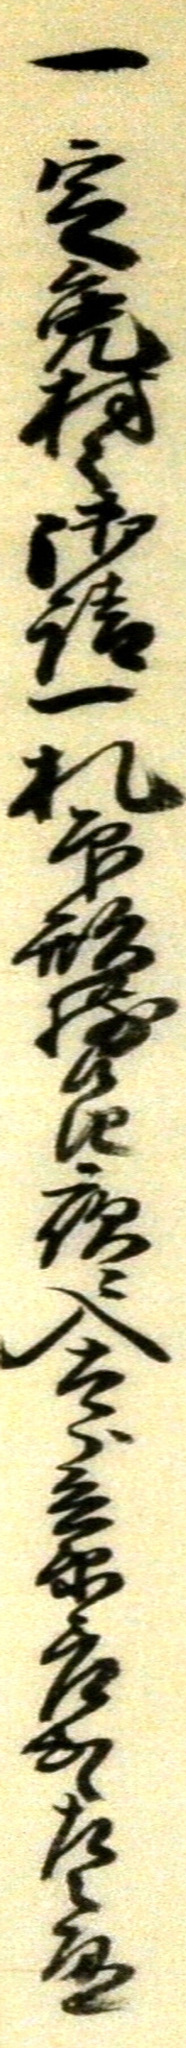一定免村々御請一札印形揃候由夜ニ入太郎兵衛差出候左之通

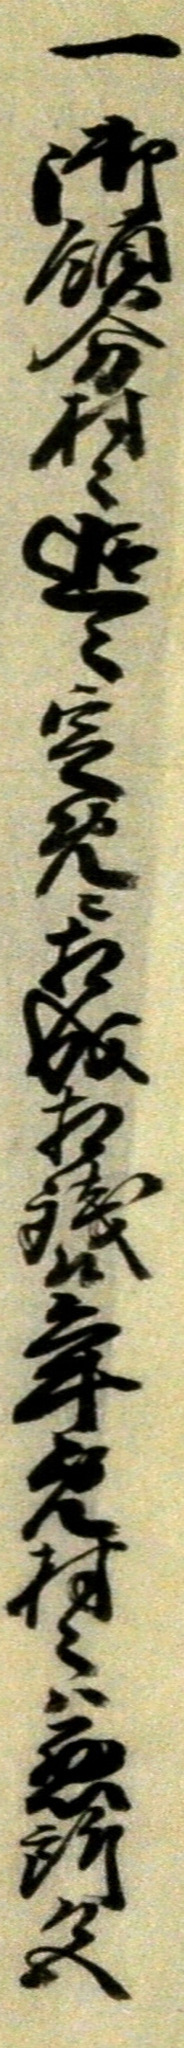一御領分村々追々定免ニ相成相残候年免村々ハ悪所色
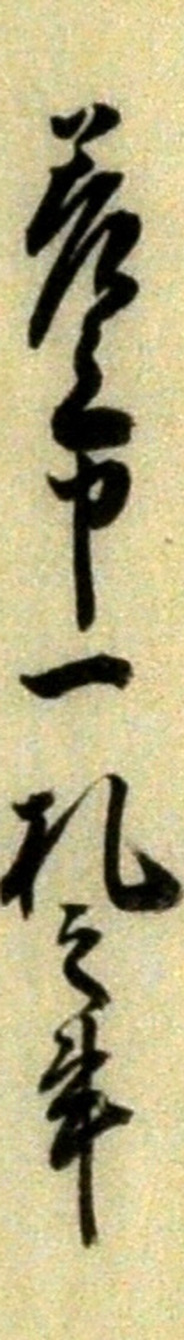差上申一札之事
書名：留書
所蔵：伊那市立高遠町図書館・合同会社AMANE
